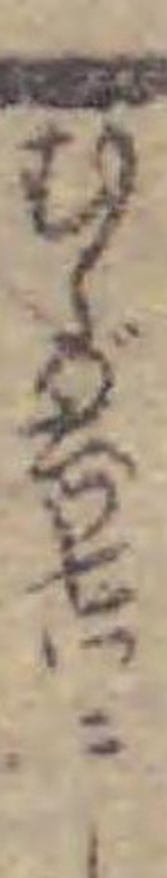むくが六ツ七ツに
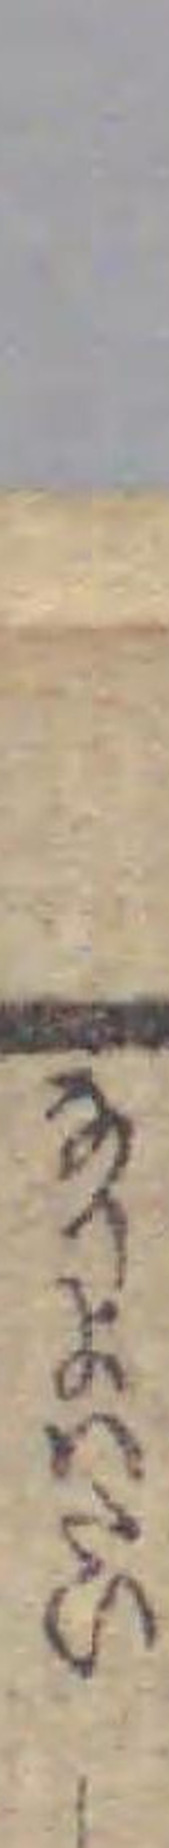なりよはたい
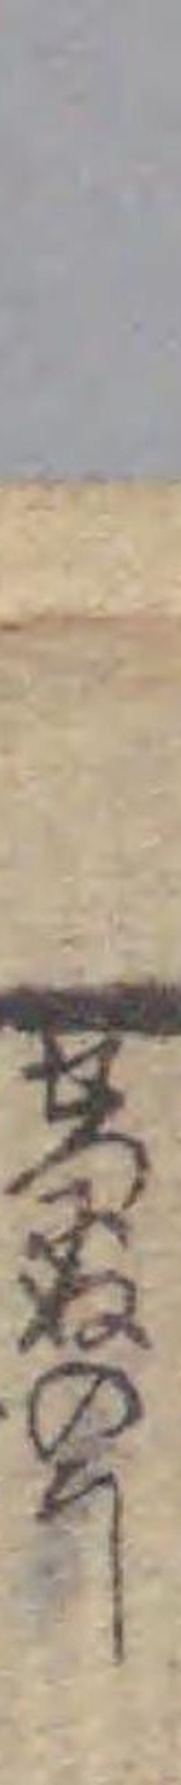せつにぬのこし
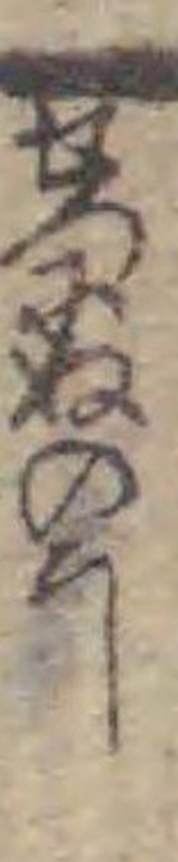せつにぬのこし
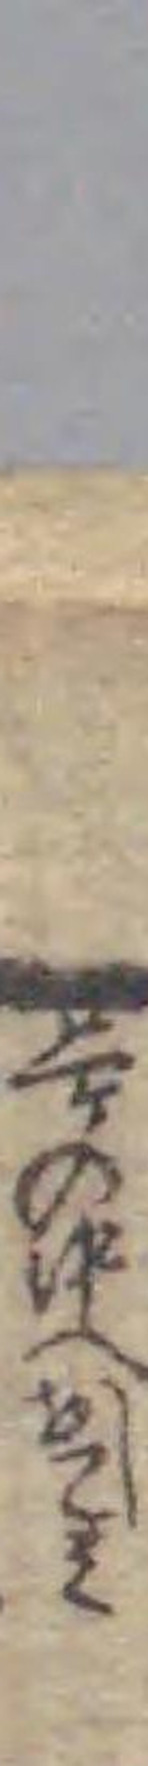上ヶの中へおしこみ
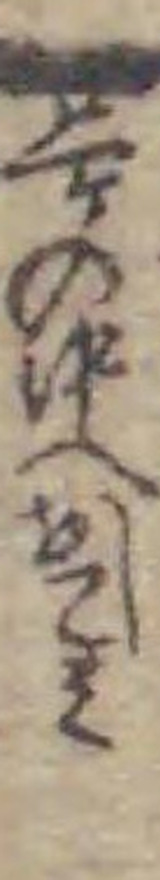上ヶの中へおしこみ
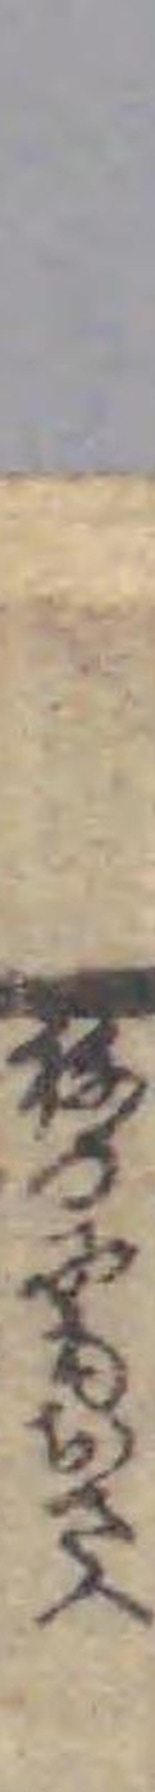ねるにもおさへ
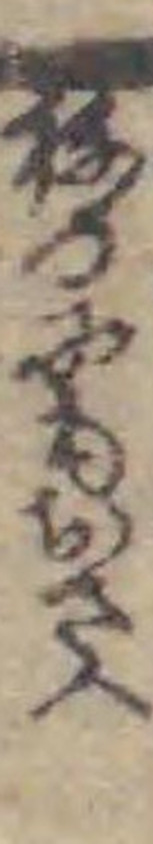ねるにもおさへ
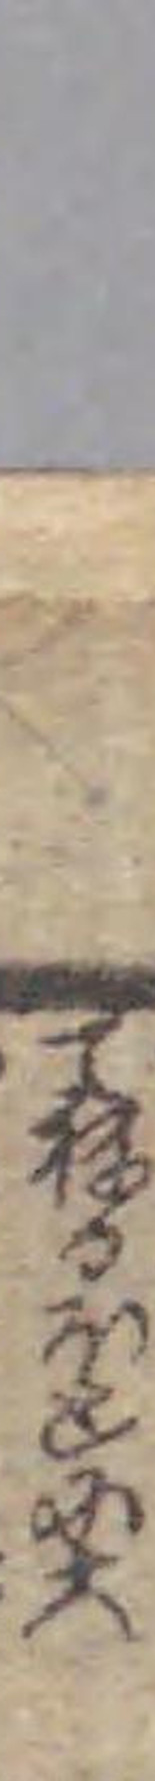てねるほどに大
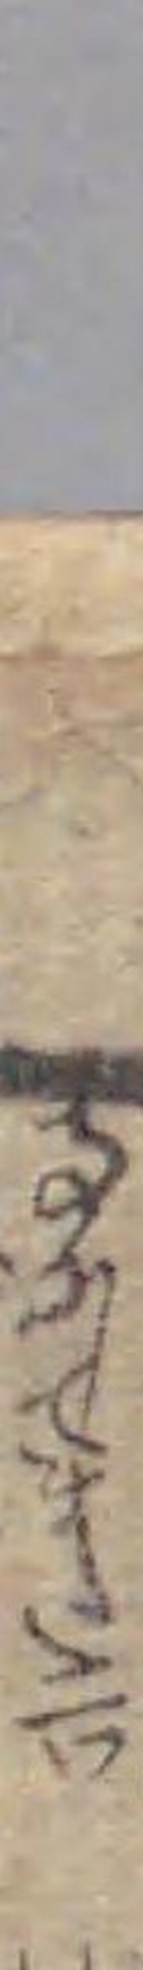事にしてまた二ツ
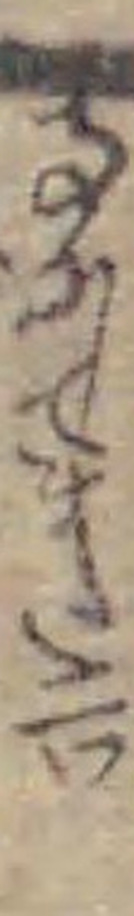事にしてまた二ツ
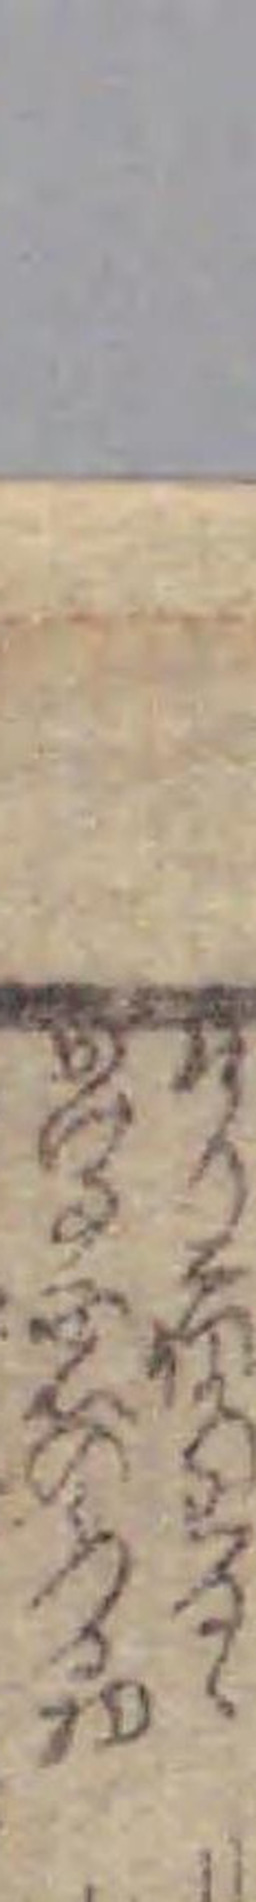かけ事に心のうつる物
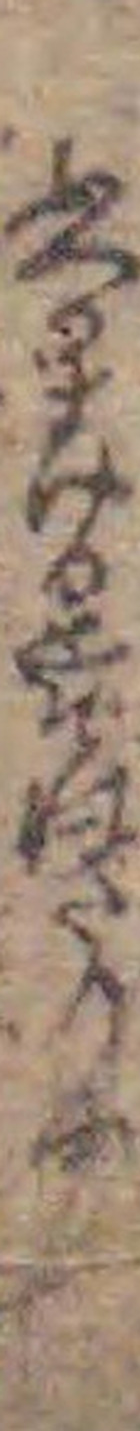ふへるまけるぞ付たりに

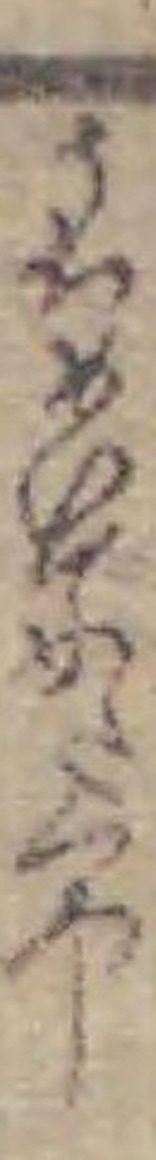うちめいてかたくるし
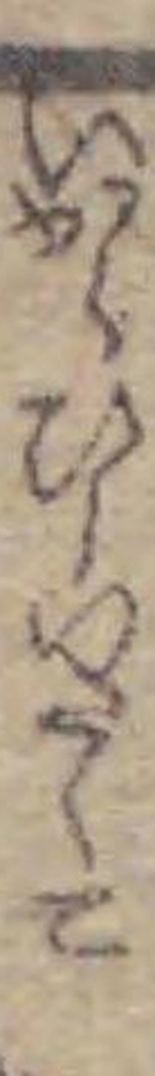いからひらつたくこ
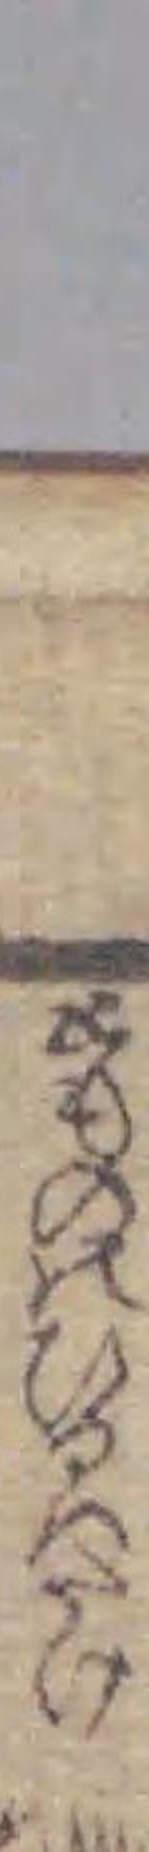どもののびるはたけ
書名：通風伊勢物語 : 3巻
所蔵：国立国会図書館 National Diet Library, JAPAN
